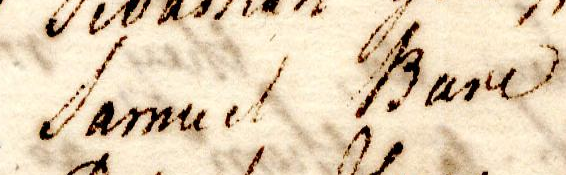Samuel Bare
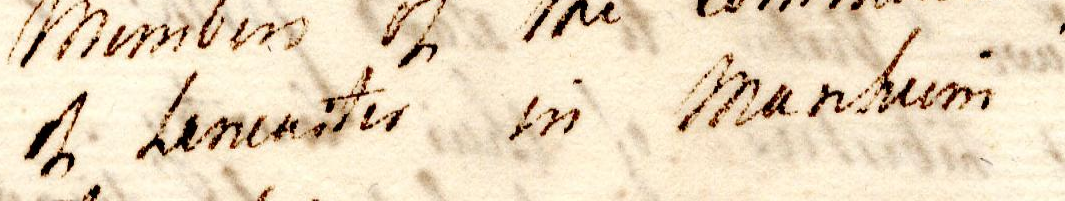of Lancaster in Manheim
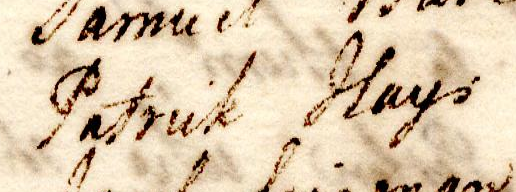Patrick Hays
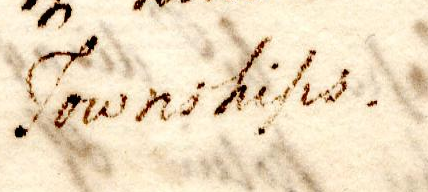Townships.
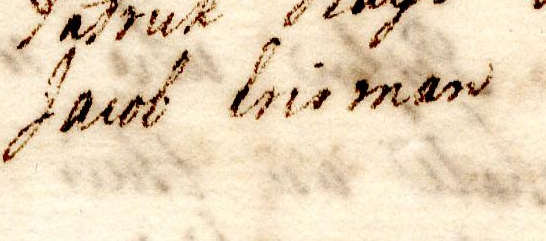Jacob Erisman
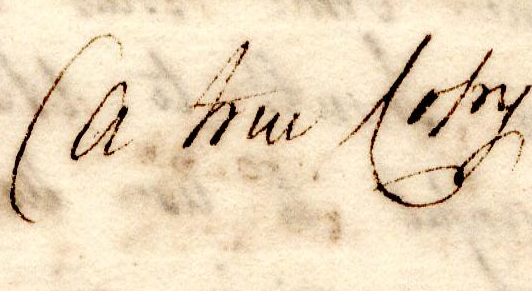(A true Copy)
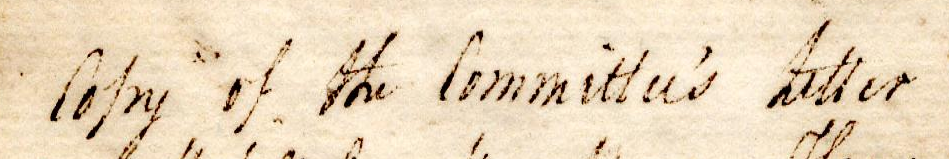Copy of the Committee's Letter
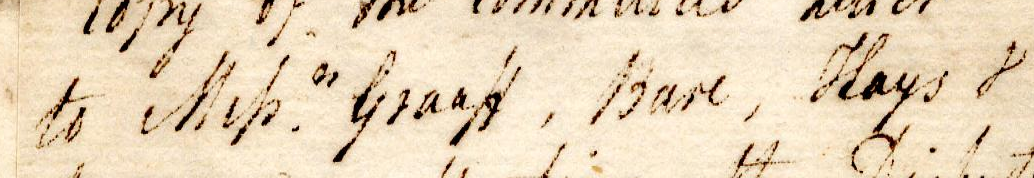to Mess^rs: Graaf, Bare, Hays &
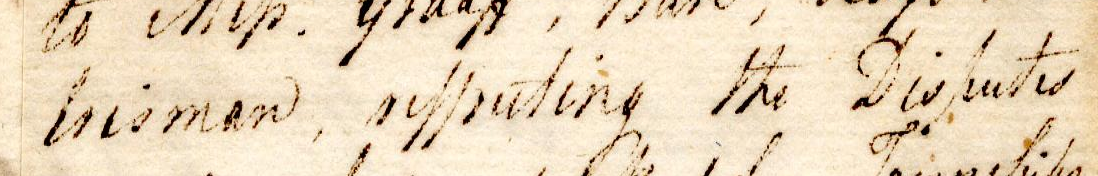Erisman, respecting the Disputes
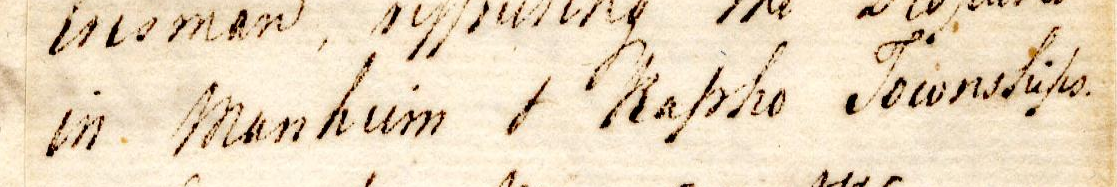in Manheim & Rapho Townships
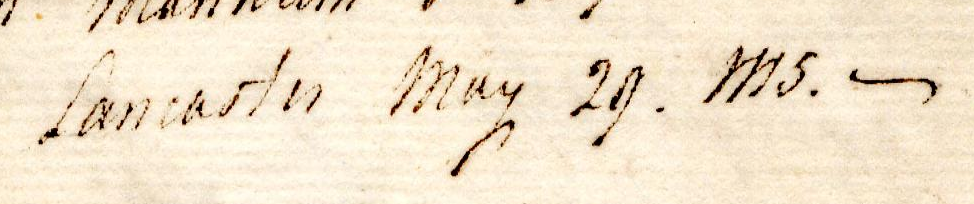Lancaster May 29. 1775.
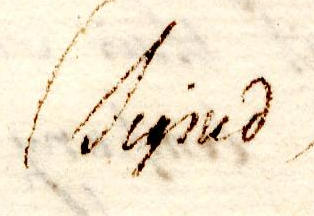(Signed)
